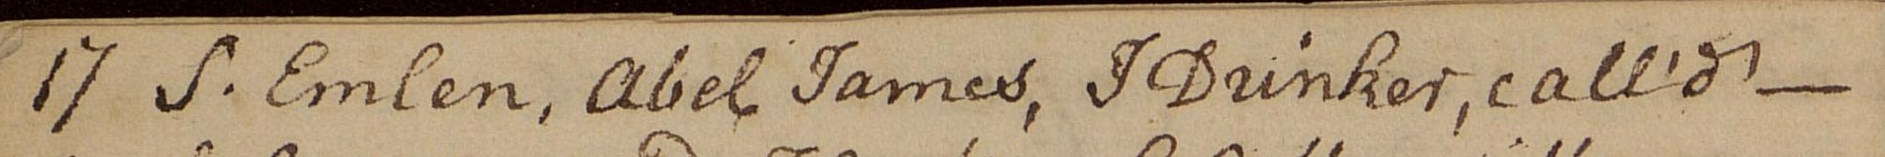17 S. Emlen, Abel James, I Drinker, call'd-
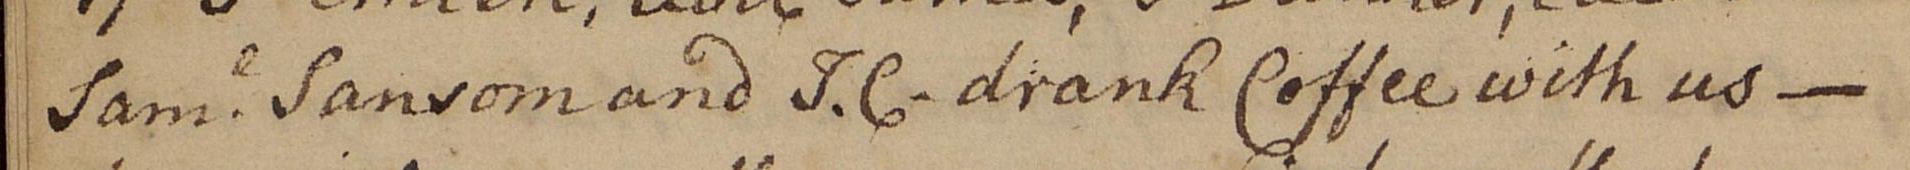Sam^l. Sansom and I.C. drank Coffee with us-
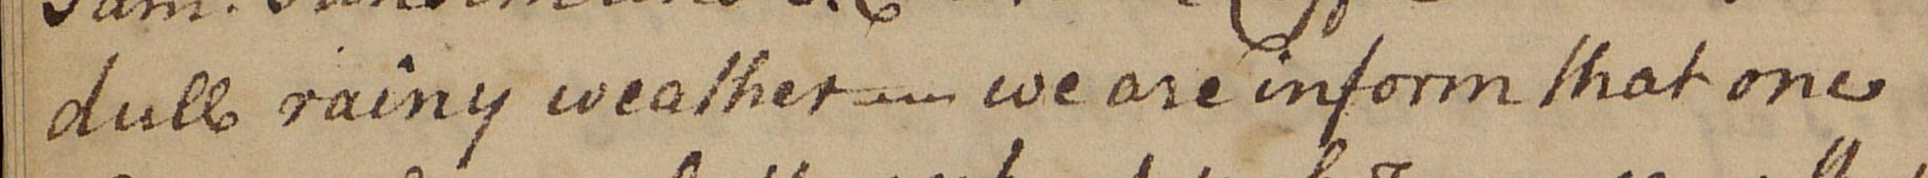dull rainy weather- we are inform that one
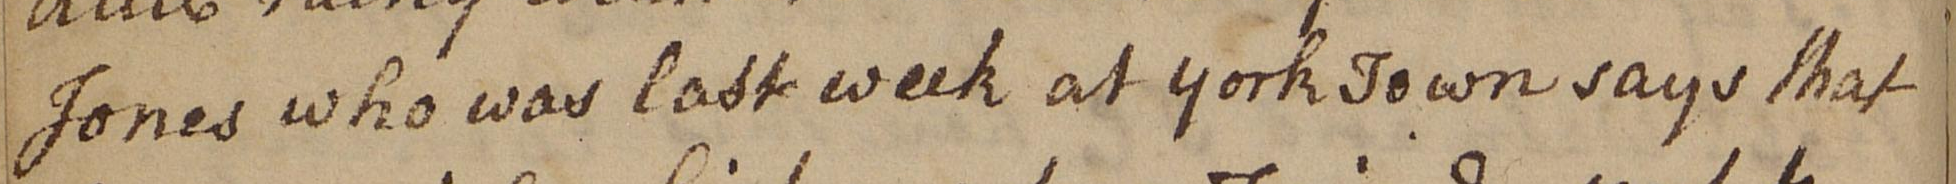Jones who was last week at York Town says that
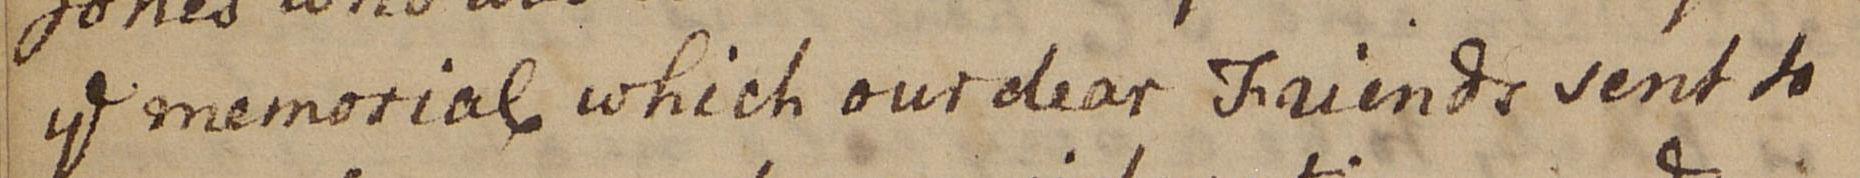y^e memorial which our dear Friends sent to
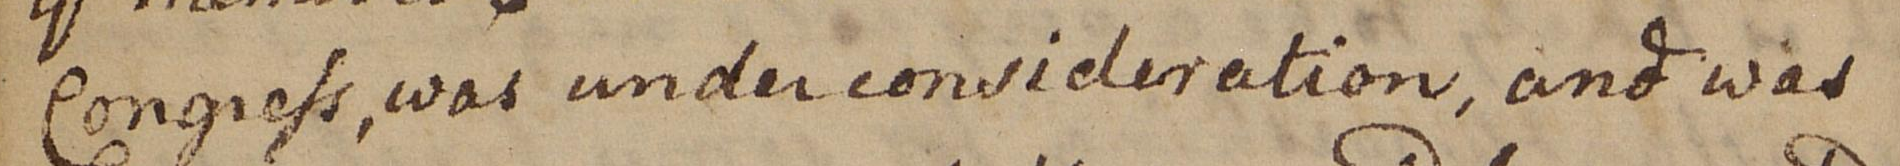Congress, was under consideration, and was
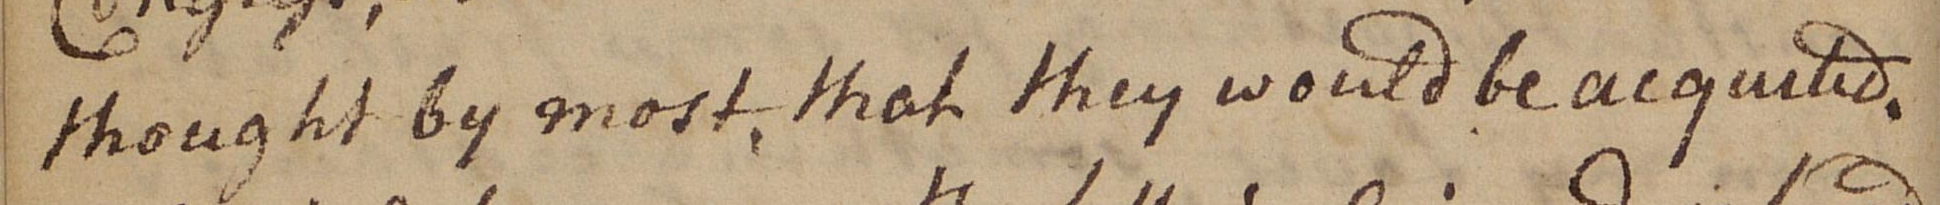thought by most, that they would be acquited,
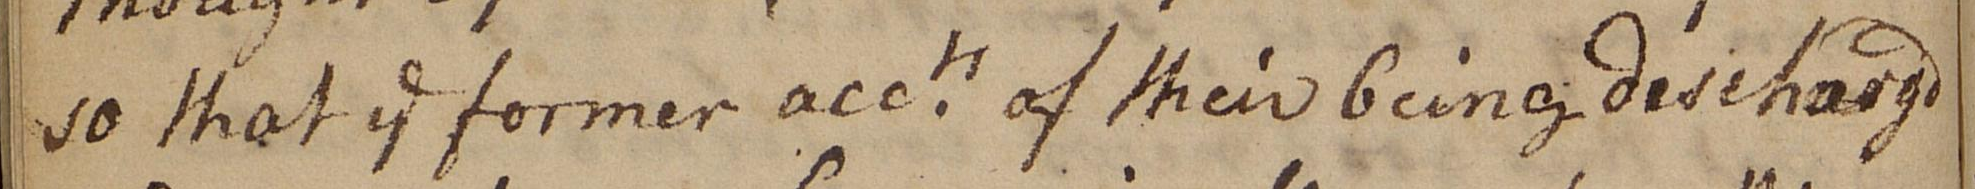so that y^e former acc^ts. of their being discharg'd
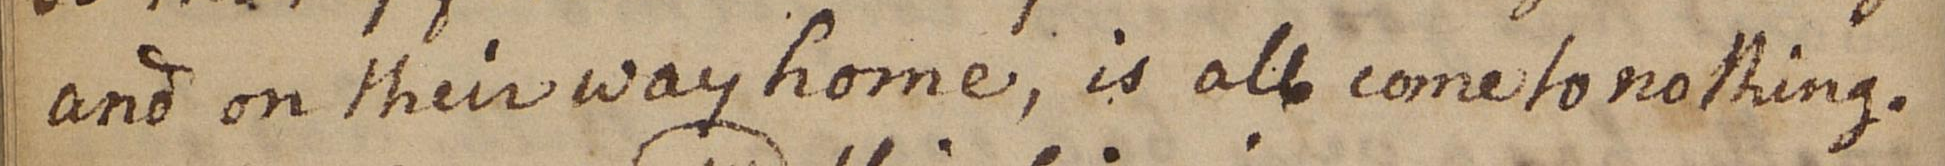and on their way home, is all come to nothing.
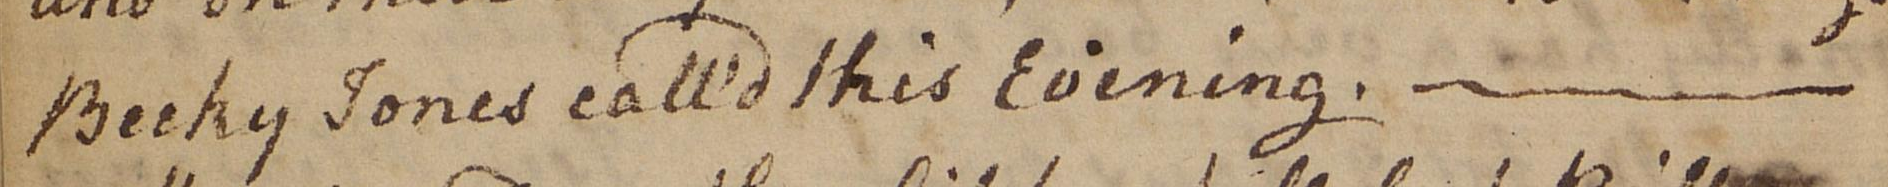Becky Jones call'd this Evening.-
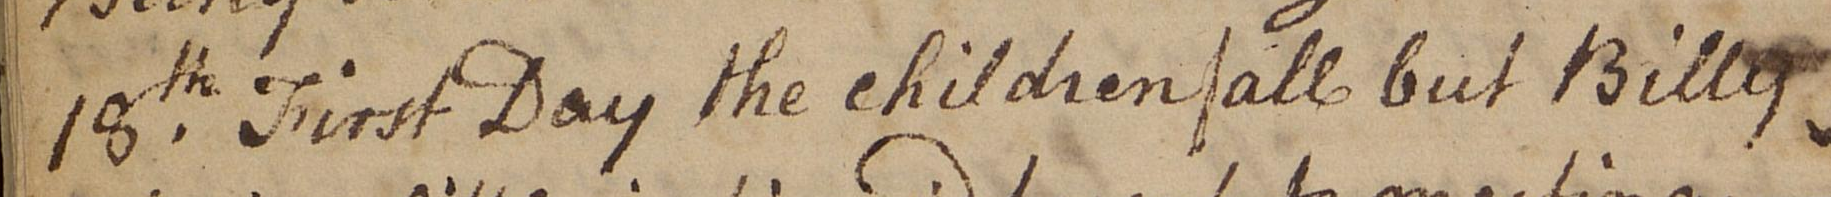18^th. First Day the children /all but Billy
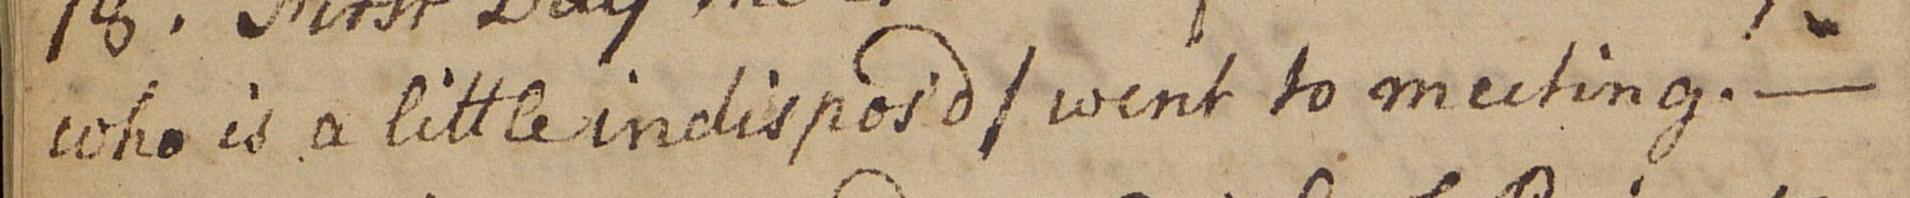who is a little indispos'd/ went to meeting.-
